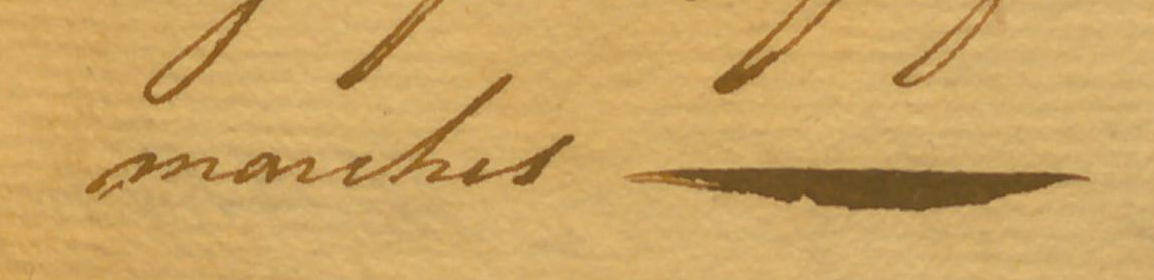marches-
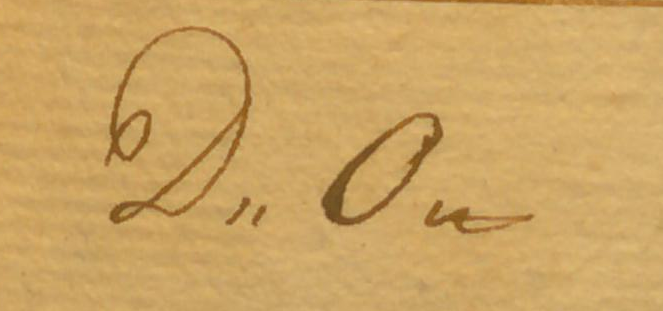D.O.
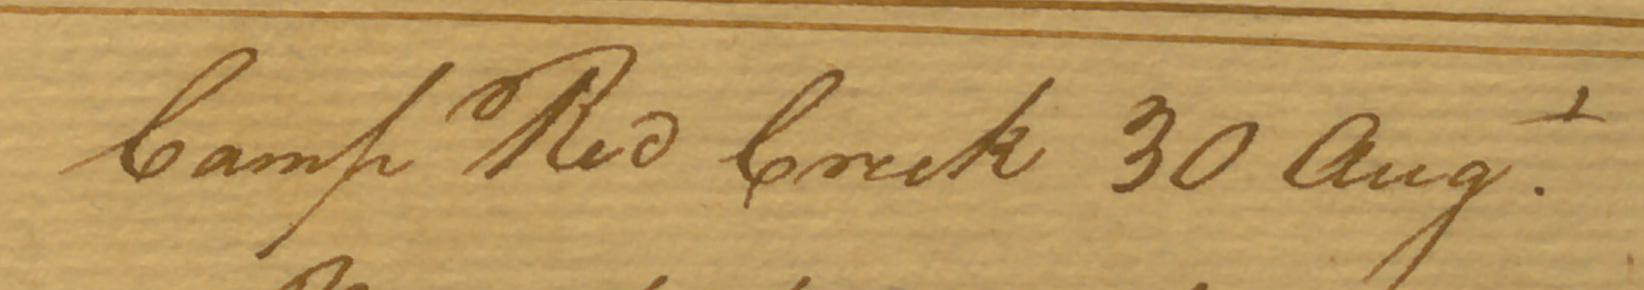Camp Red Creek 30 Aug^t.
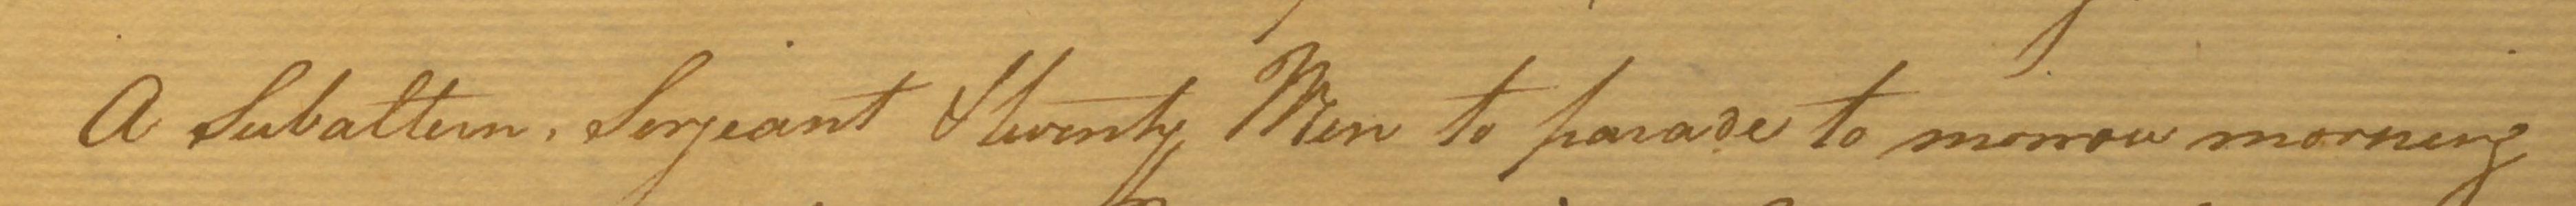A Subaltern, Serjeant & twenty Men to parade to morrow morning
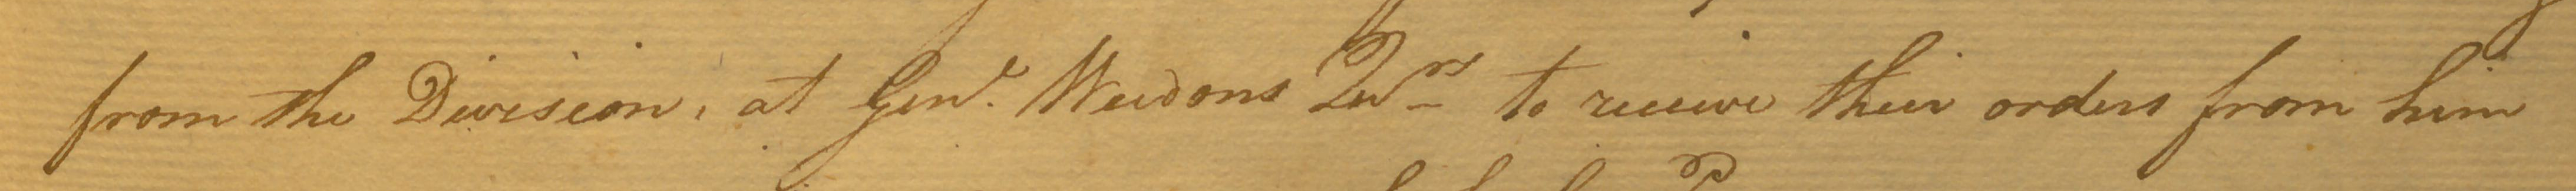from the Division, at Gen^l. Weedons Qu^rs. to receive their orders from him
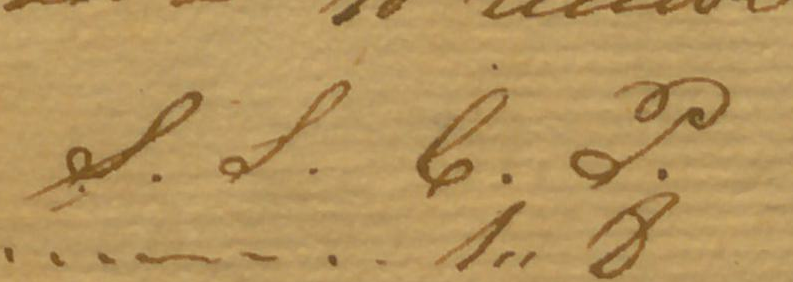S. S. C. P.
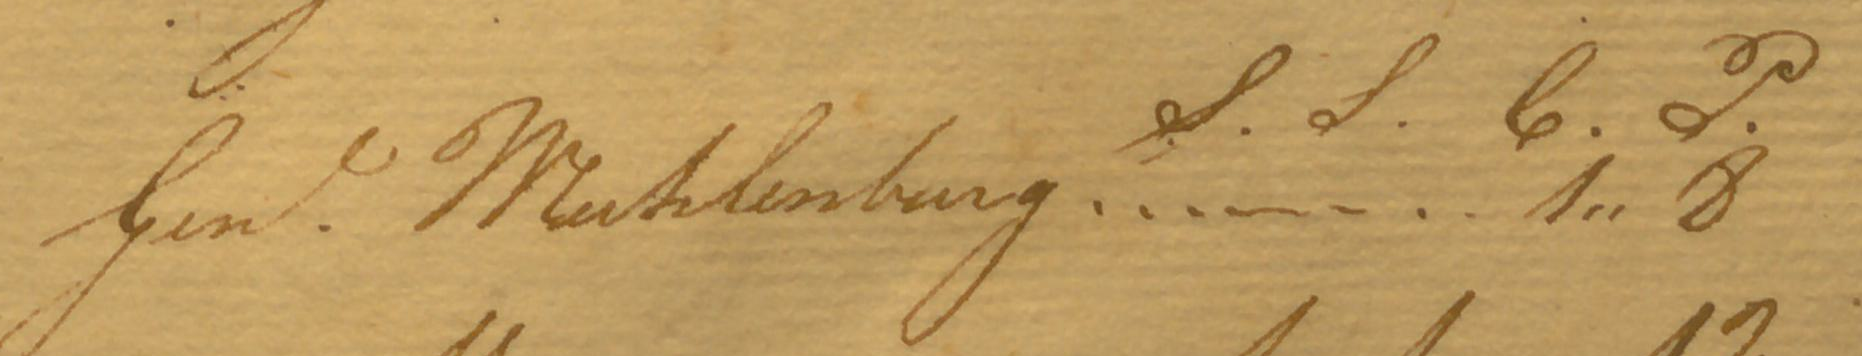Gen^l. Muhlenburg ...... 1. 8
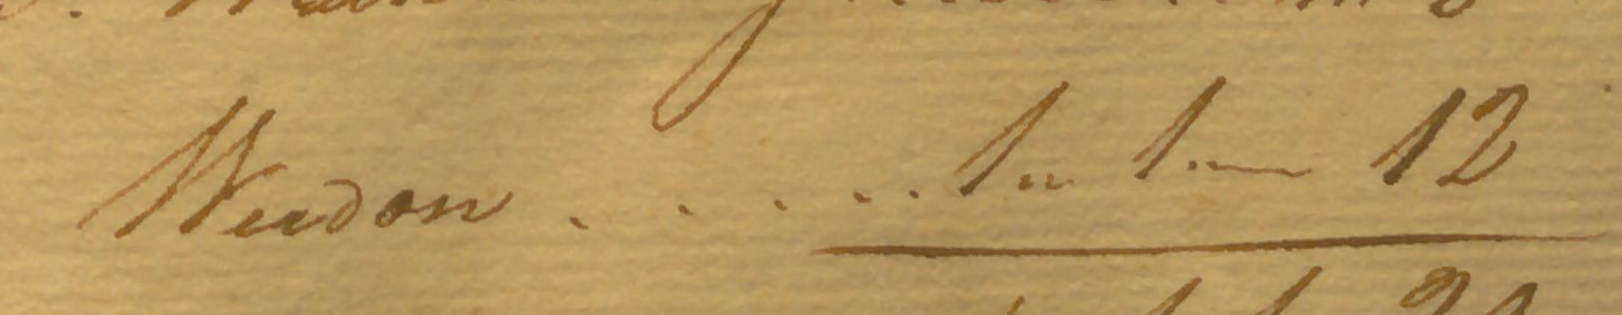Weedon ..... 1. 1.- 12
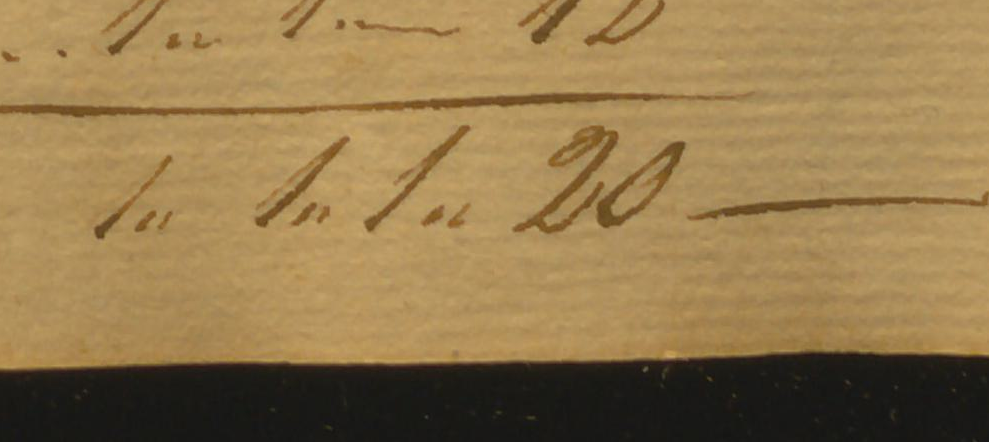1. 1. 1. 20-
